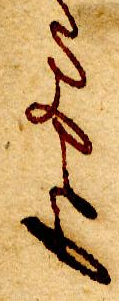Order
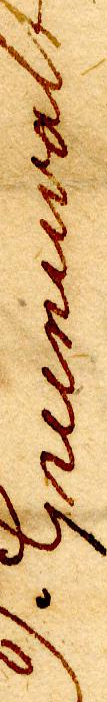P. Greenwalt
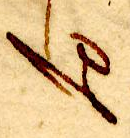to
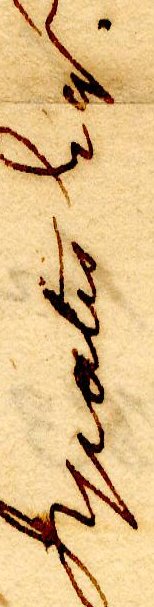J Yeates Esq^r
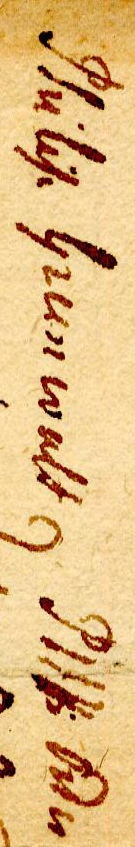Philip Greenwalt Pill Order
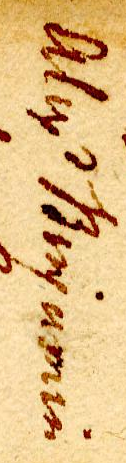Alex^r Benjamin
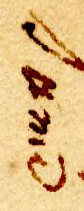Same
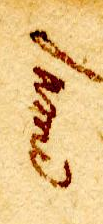Same
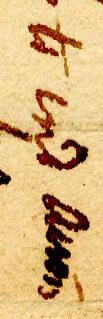to end Accot
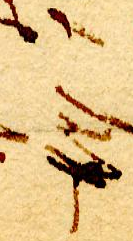& Bitt
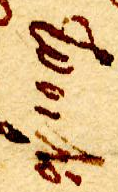Tooks
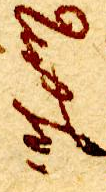Esq^r for
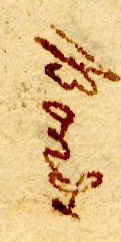Bonds
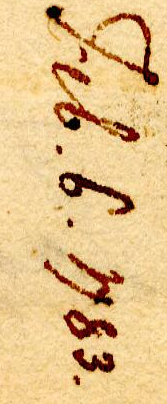Feb. 6. 1783.
